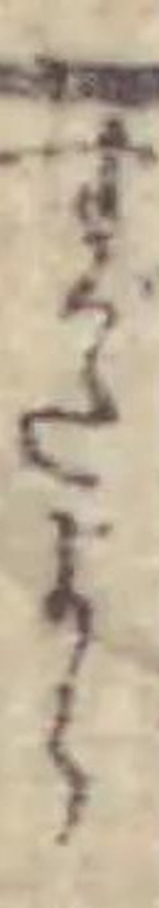すがたよし
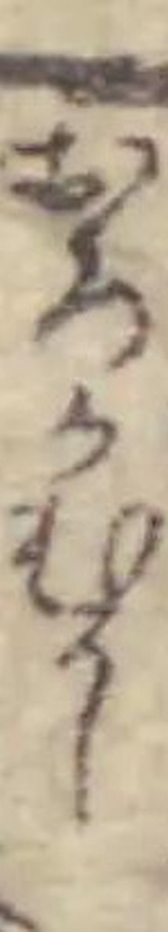おろかむかし
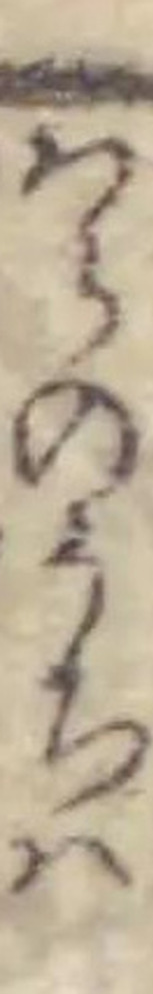はらのうちは
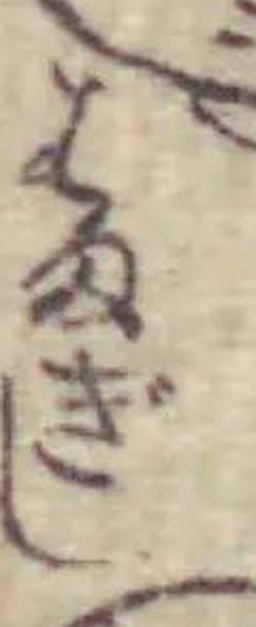はまぎし
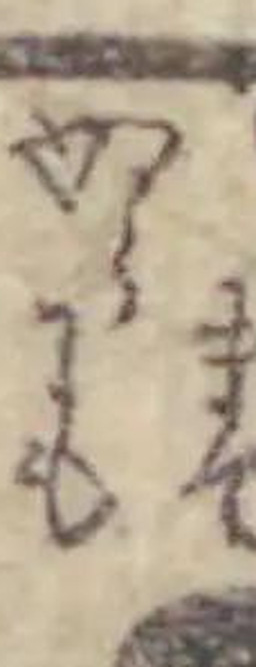からにも
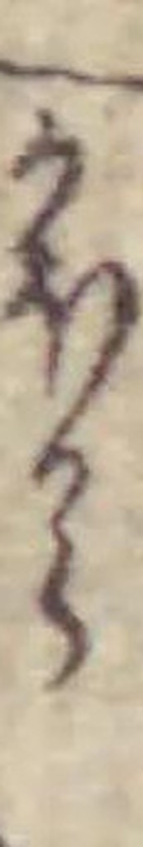かほから
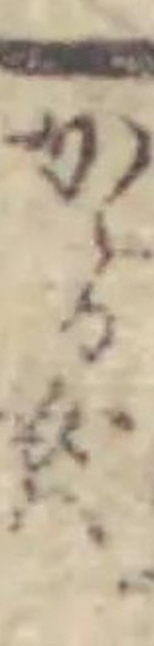かゝる女は
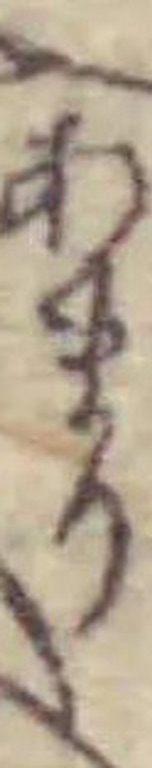あまり
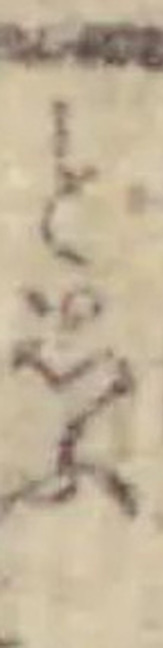と思ふ
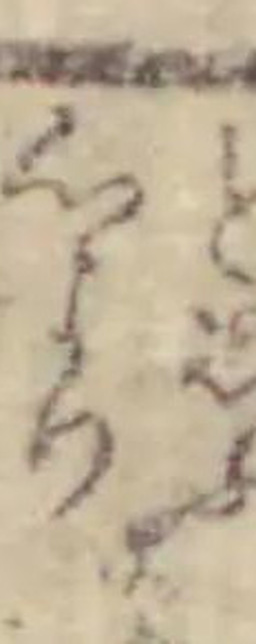心より
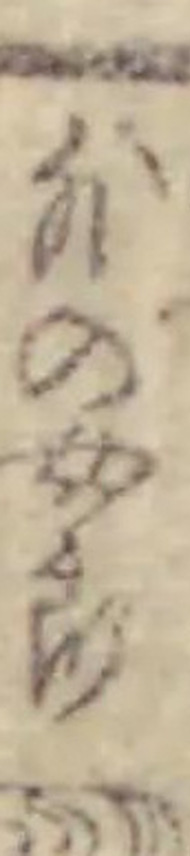外の女郎
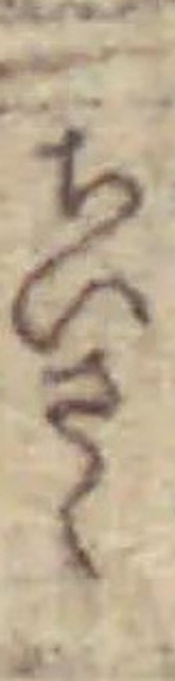ちいさく
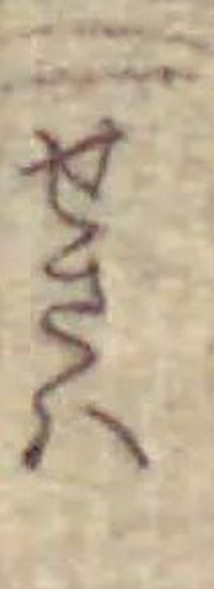せざは
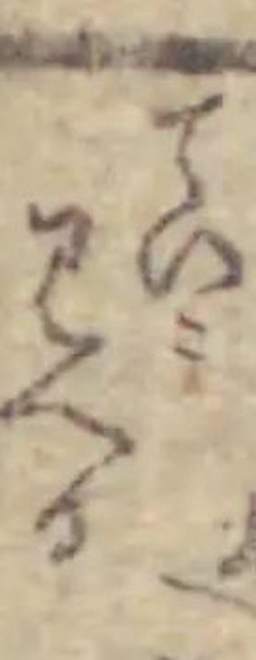見へる
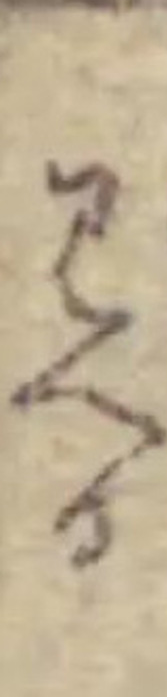見へる
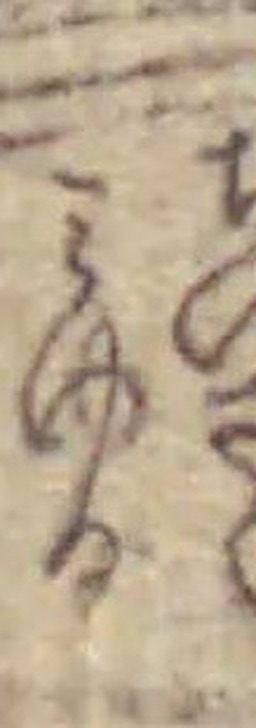みゆる
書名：亀山人家妖 3巻
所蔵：国立国会図書館 National Diet Library, JAPAN
